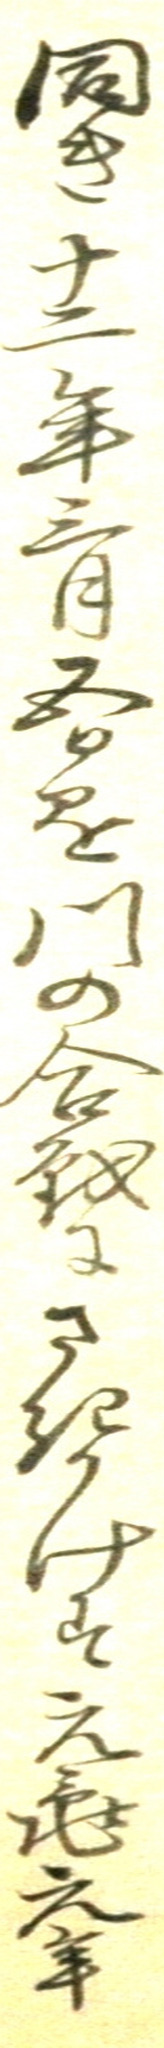同き十二年三月五日懸川の合戦にさきかけす元亀元年
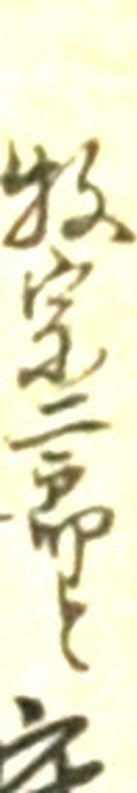牧宗二郎と
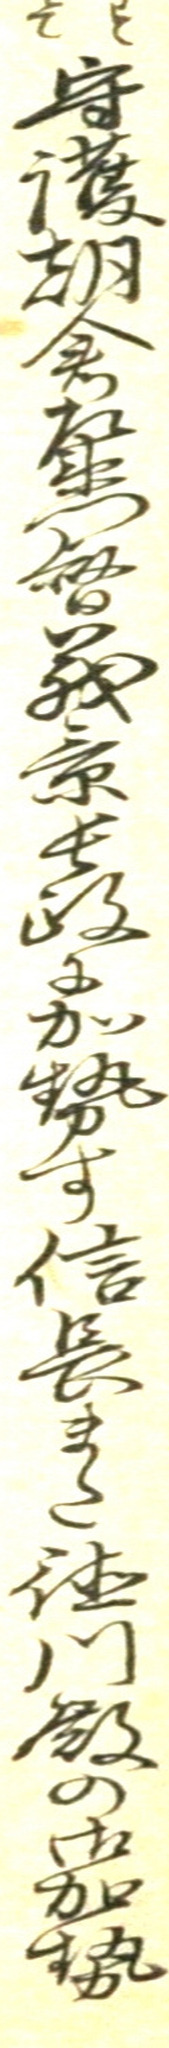守護朝倉左衛門督義景長政に加勢す信長また徳川殿の御加勢
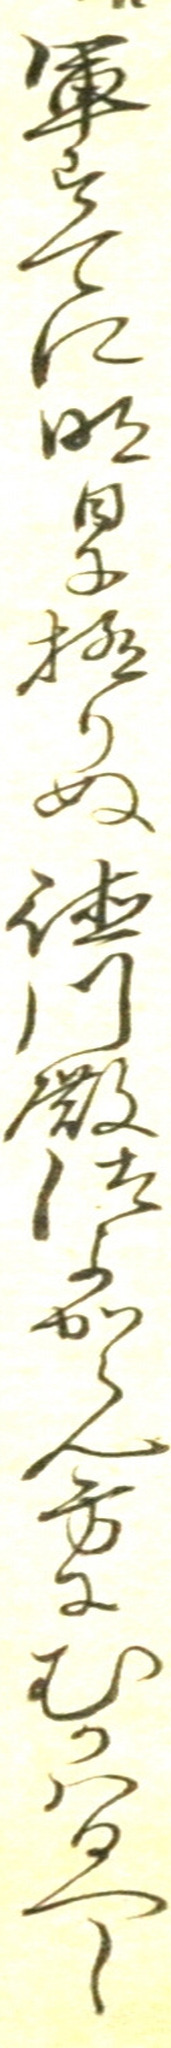軍すてに明日に極りぬ徳川殿つよからん方にむかはるへし
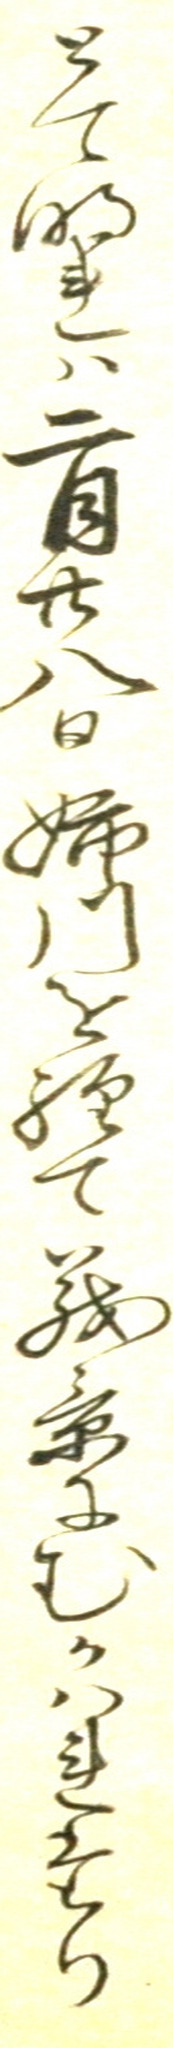とて明れは二月廿八日姉川を経て義景にむかはれたり
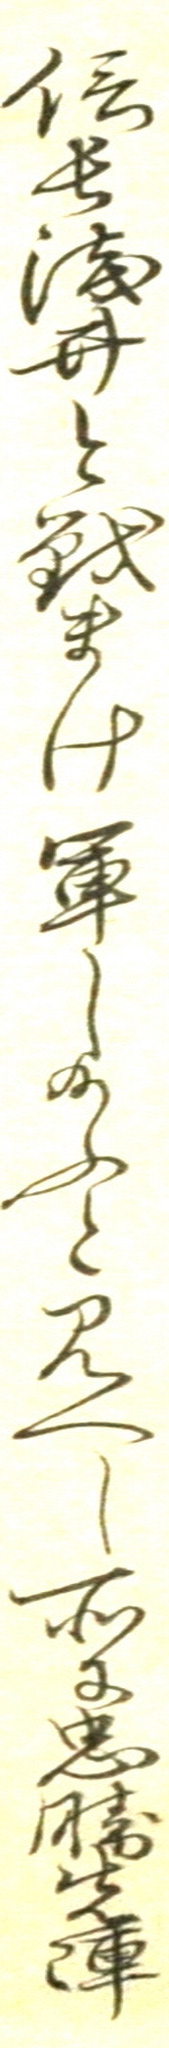信長浅井と戦まけ軍し給ふと見へし所に忠勝先陣
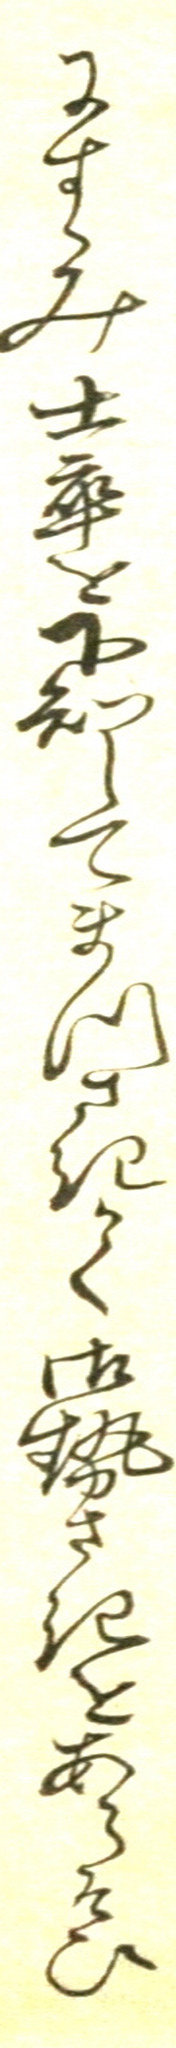にすゝみ士卒を下知してまつさきかく御勢さきをあらそひ
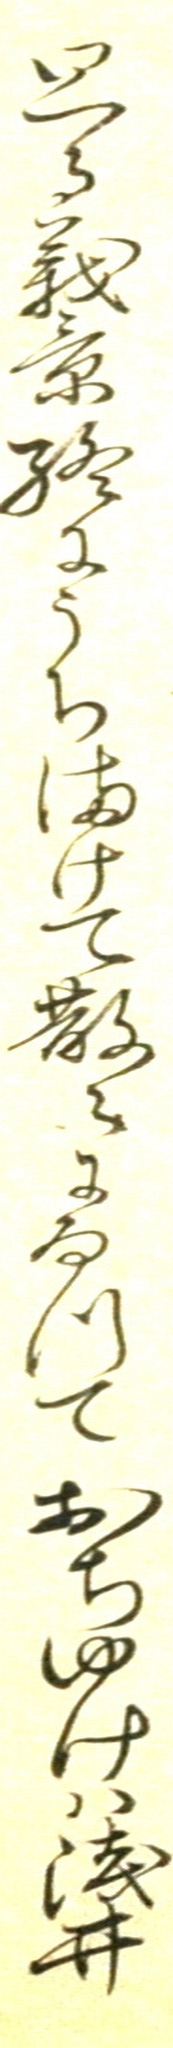わくる義景終にうちまけて散々になつておちゆけは浅井
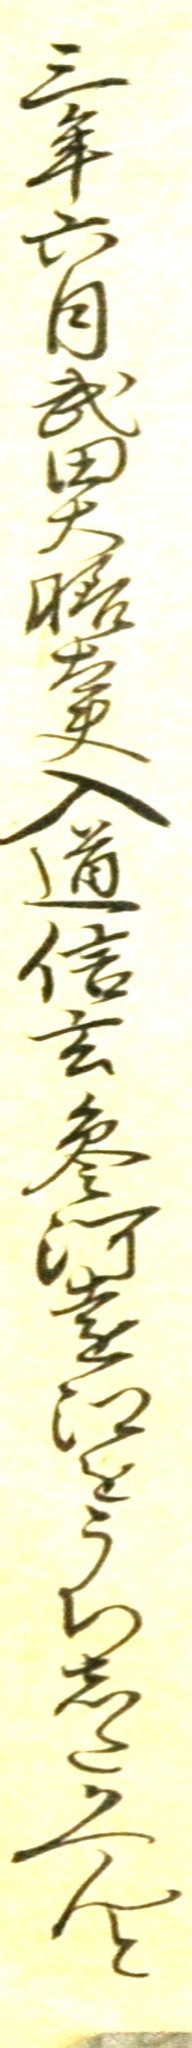三年六月武田大膳太夫入道信玄参河遠江をうちしたかへんと

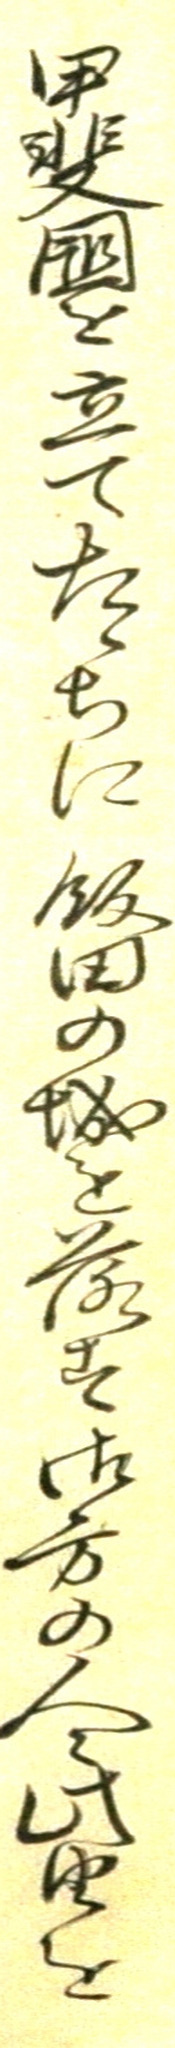甲斐国を立てたゝちに飯田の城を落す御方の人々此由を
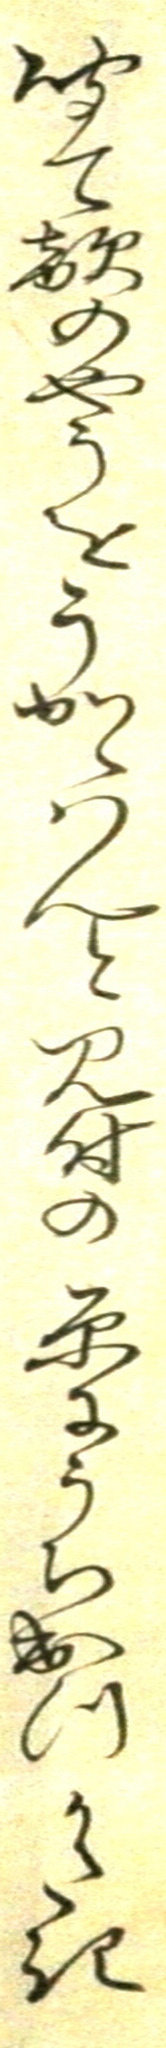聞て敵のやうをうかゝはんと見付の原にうち出つかたき
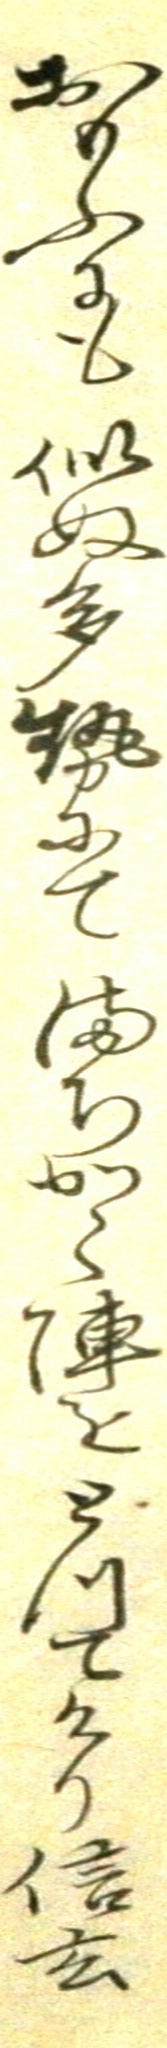おもふにも似ぬ多勢にてまちかく陣をとつてけり信玄
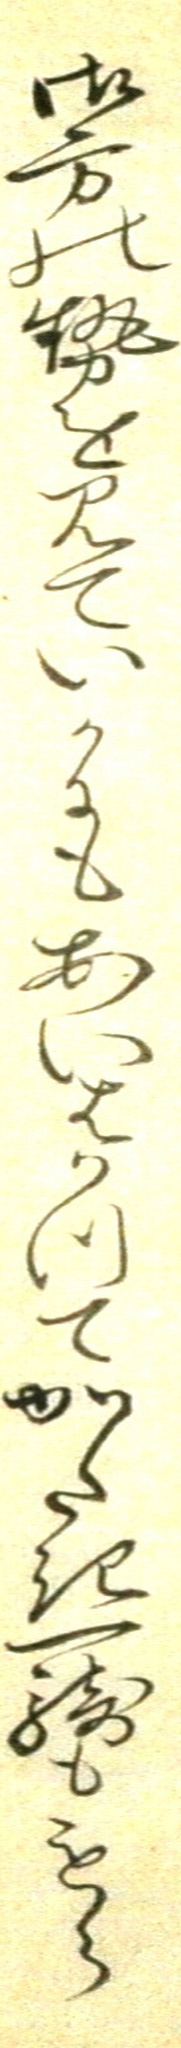御方の勢を見ていかにもあいはかつてかたき一騎ももら
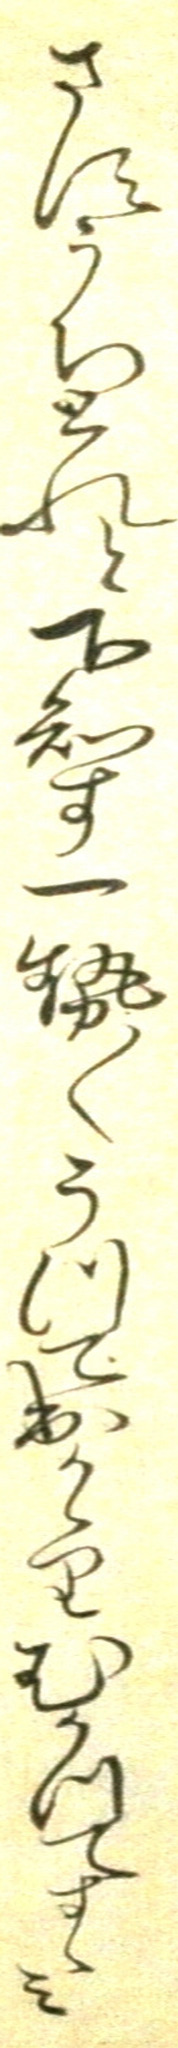さすうちとれと下知す一勢〳〵うつて出かゝりむかつてすゝみ
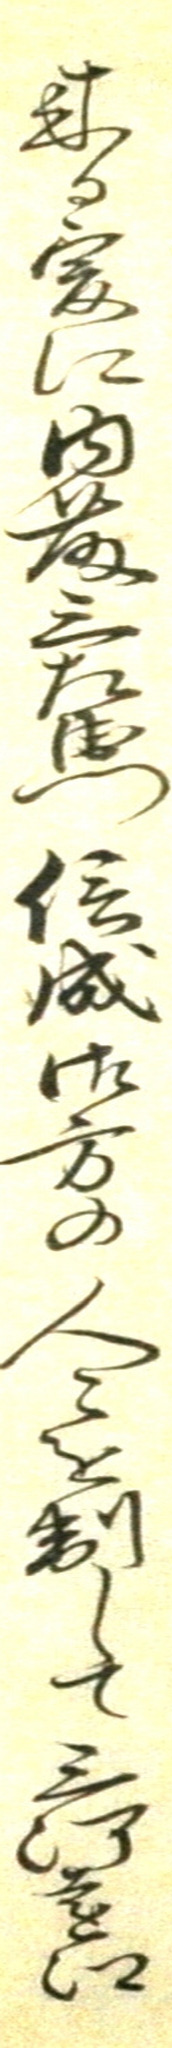来る爰に内藤三左衛門信成御方の人々を制して三河遠江
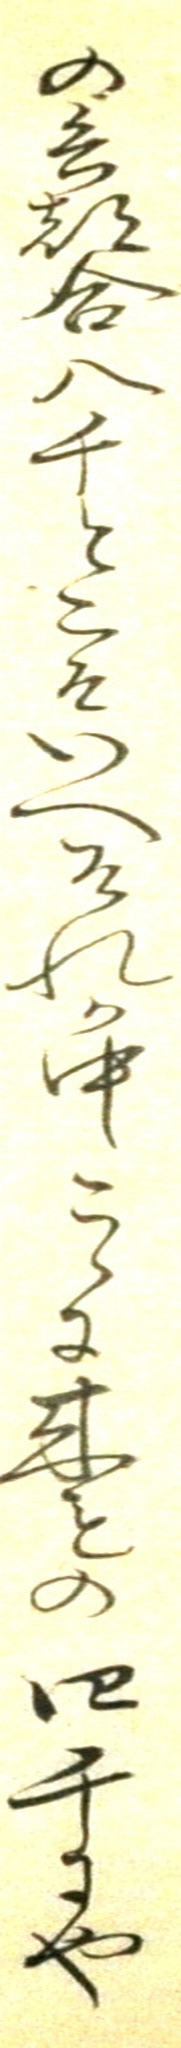の兵都合八千とこそいへそれか中こゝに来もの四千にや
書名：藩翰譜（四・上）
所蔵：伊那市立高遠町図書館・合同会社AMANE
